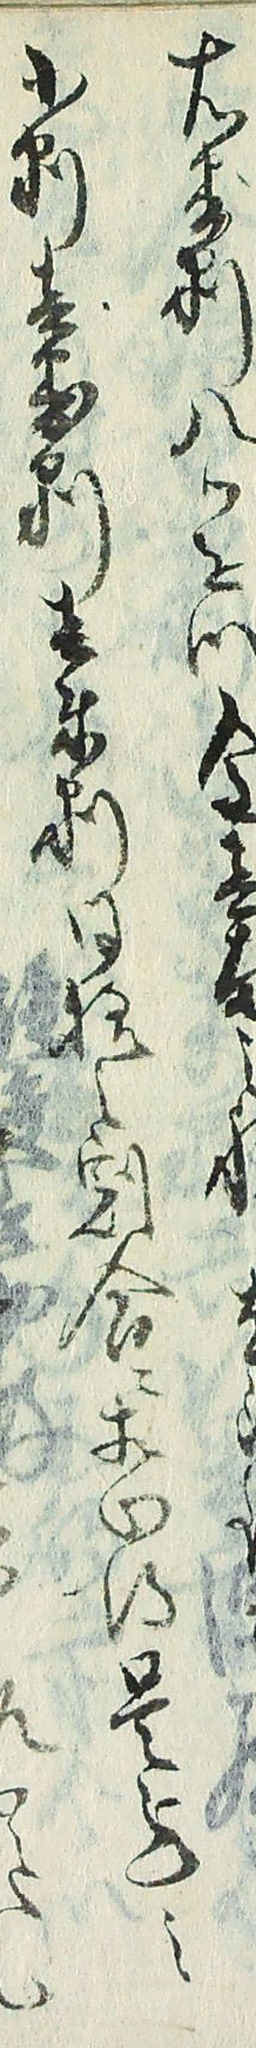小判壱歩判壱朱判同様之割合に相心得是迄之
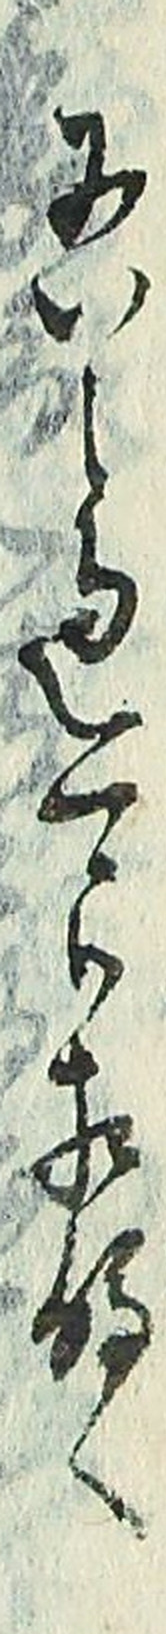右之通可被相触候
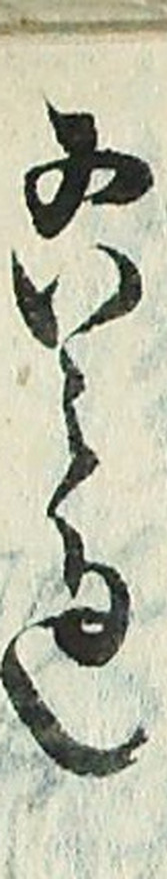右之通
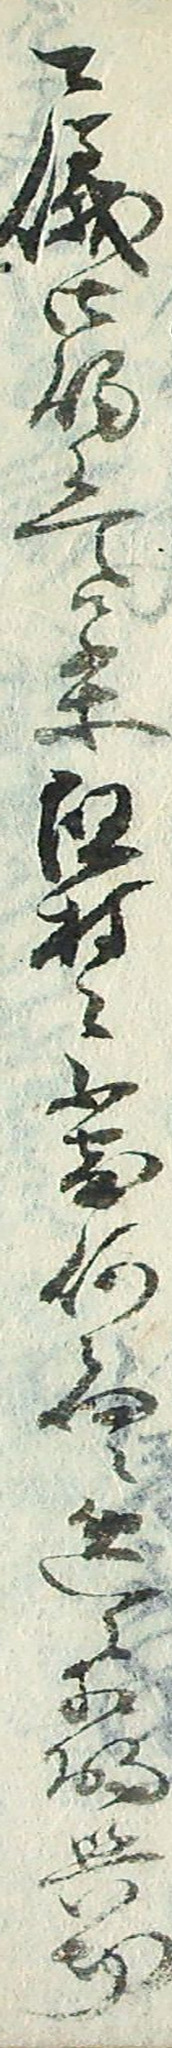公儀御触有之候条組村々不寄何者に逸々相触与切
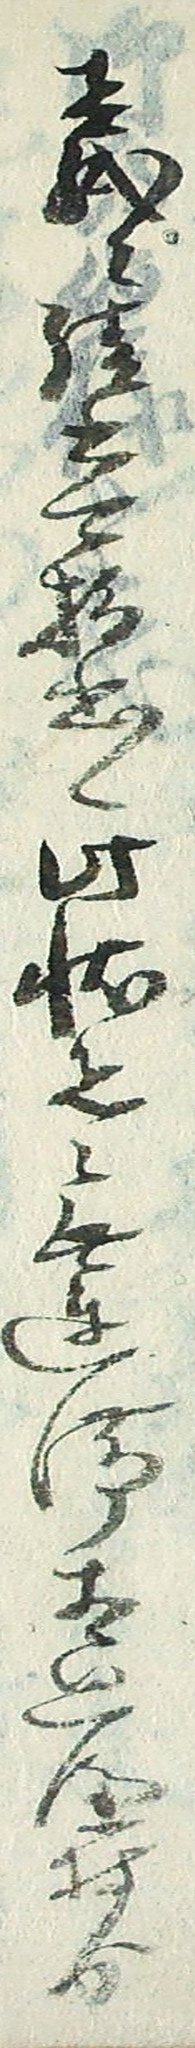壱紙に請書可指出候此状先々無遅滞相廻済村ゟ
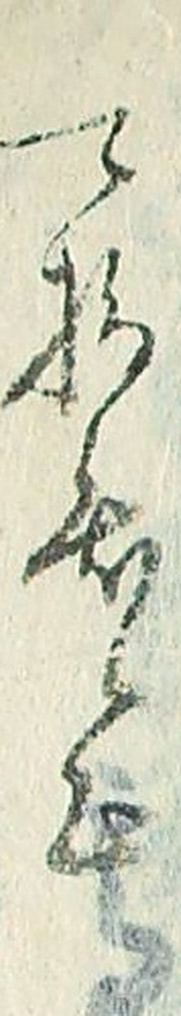可指戻候以上
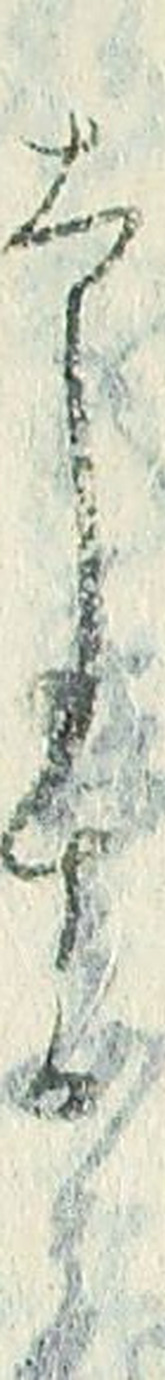十一月十日

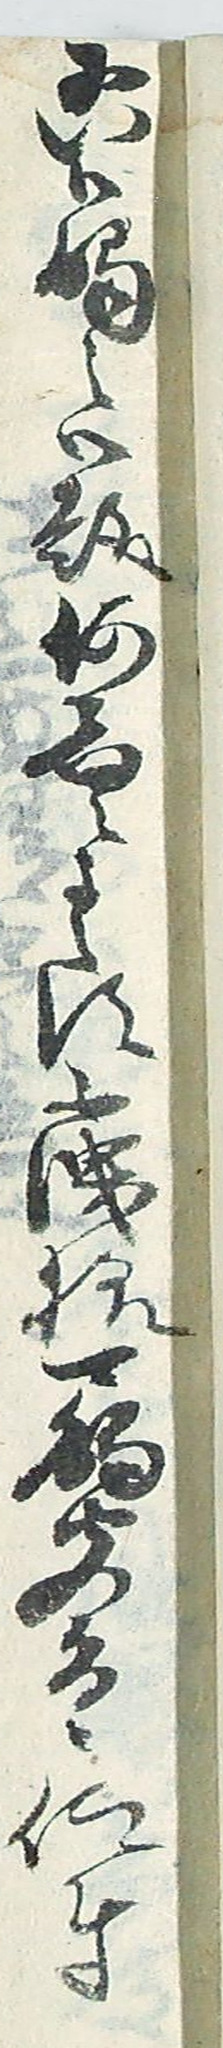右御触之御趣何者によらす不洩様可触聞旨被仰付
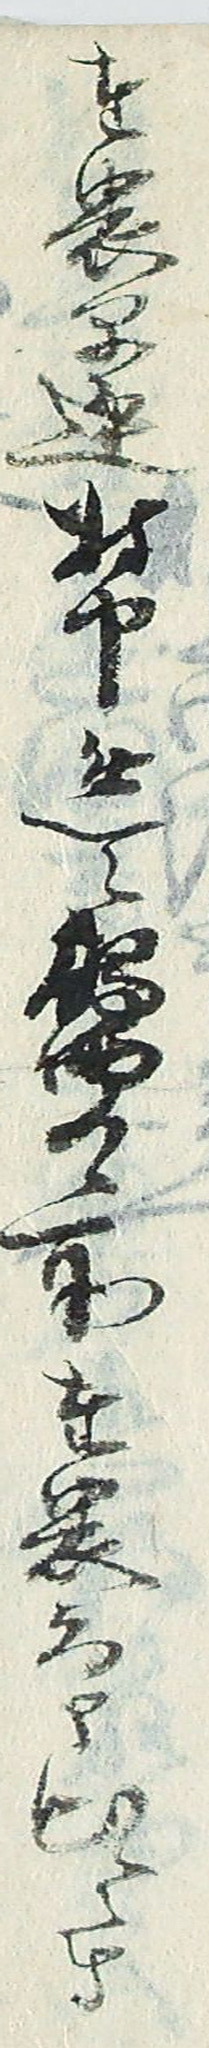奉畏早速村中逸々触聞候所奉畏旨申出候に付
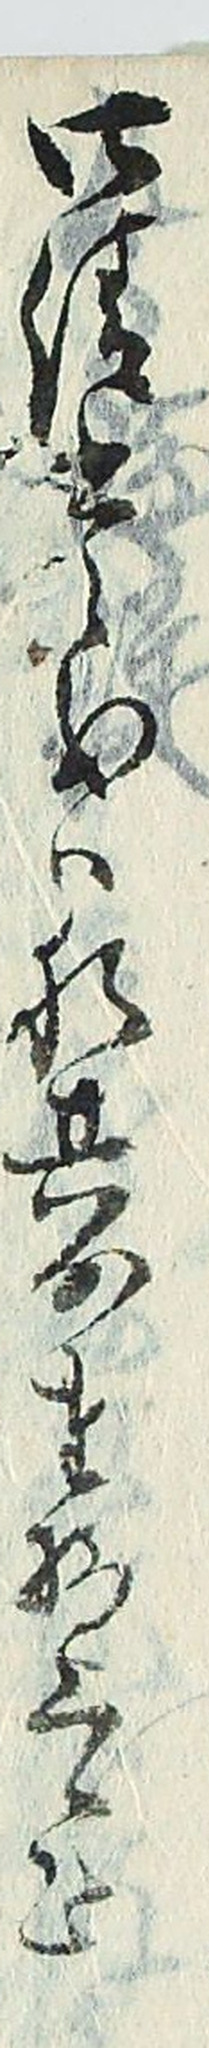御請書之義は私共ゟ奉指上候以上
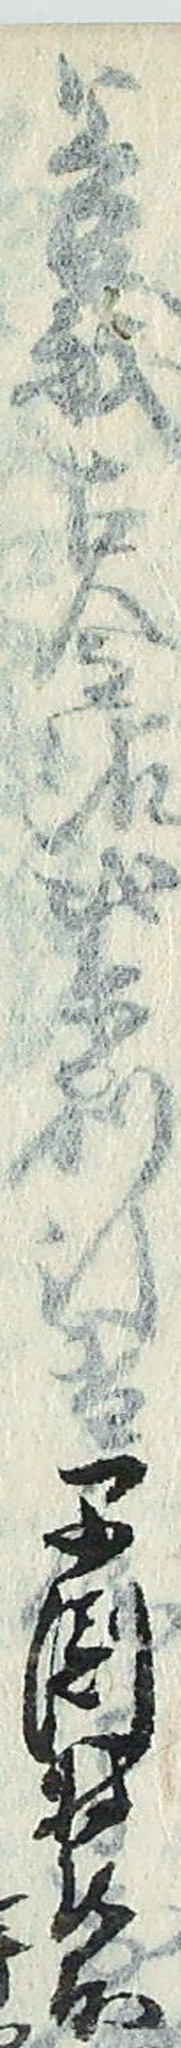早淵村庄屋
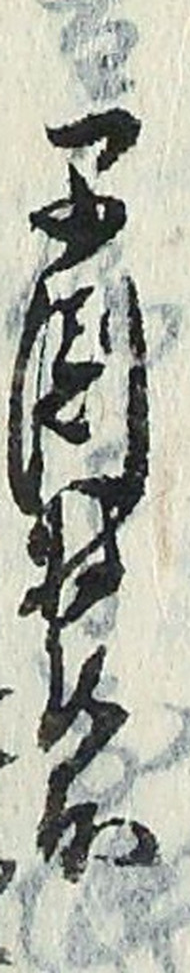早淵村庄屋
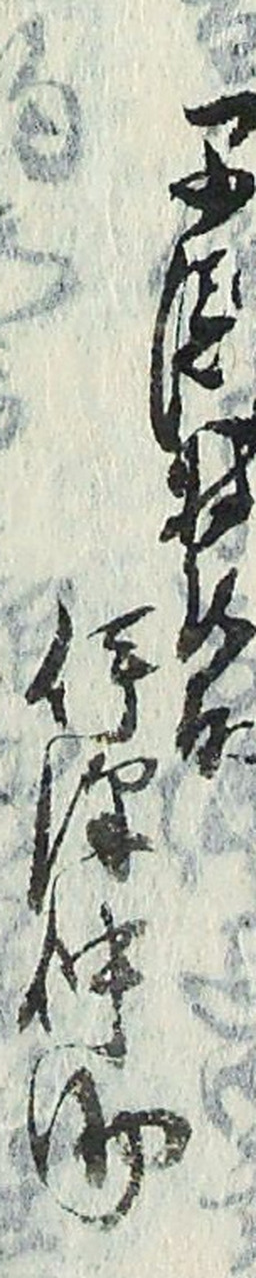伊澤仲助
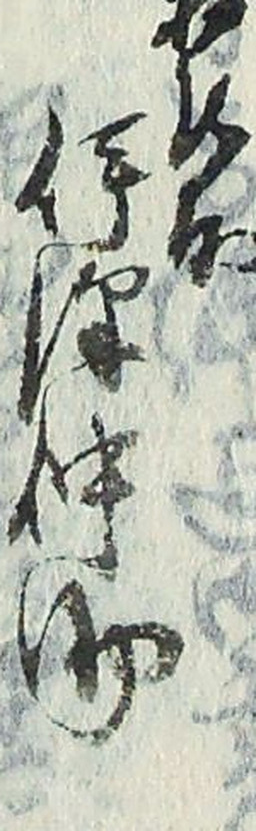伊澤仲助
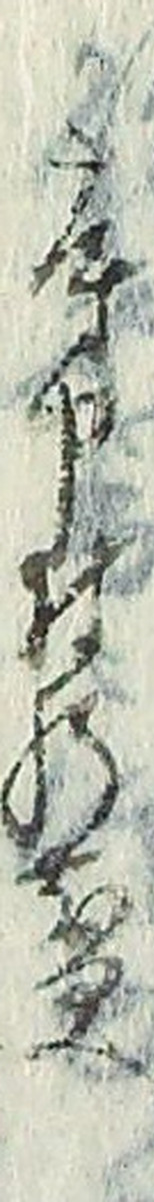真野村肝煎
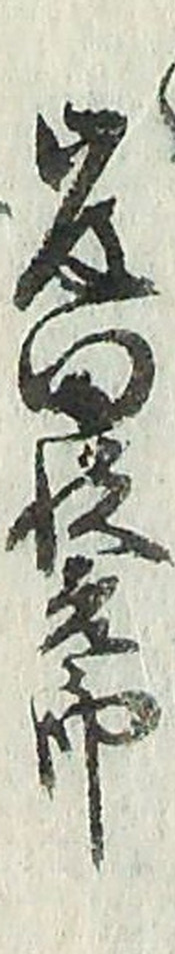岸田快吉郎
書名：諸御用御□受書控
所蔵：鳴門教育大学 Naruto University of Education
